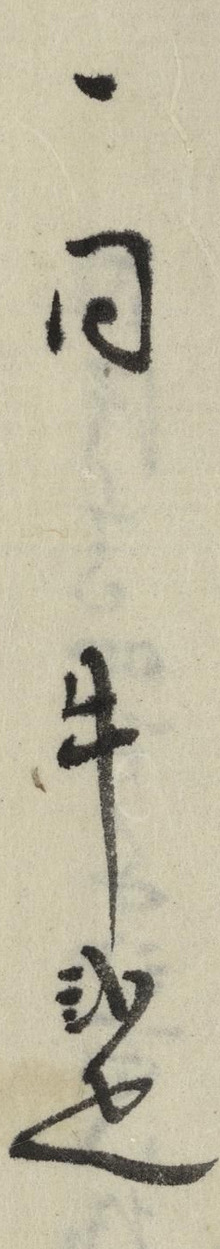一同牛弐疋
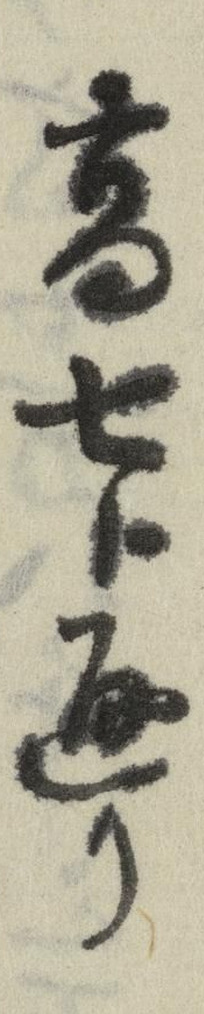高七分通り
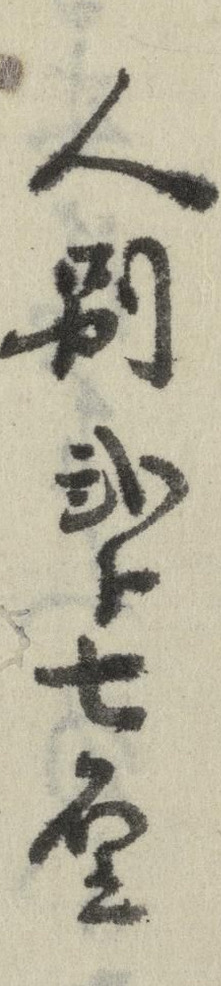人別弐分七厘減
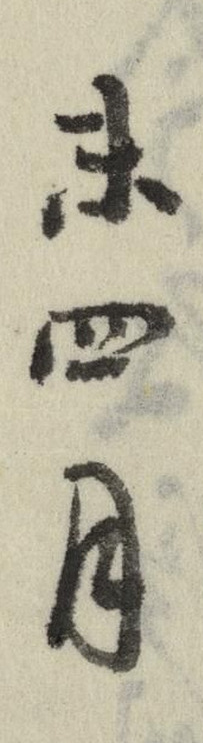未四月
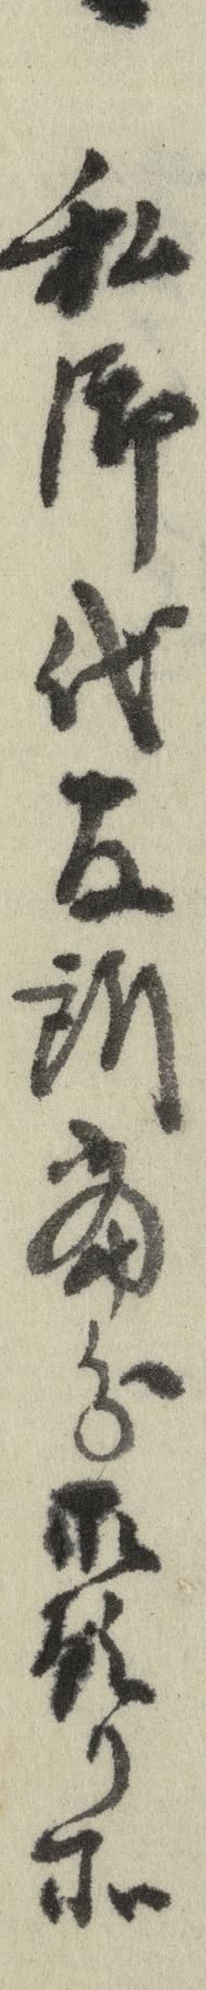一私御代官所当分御預り所
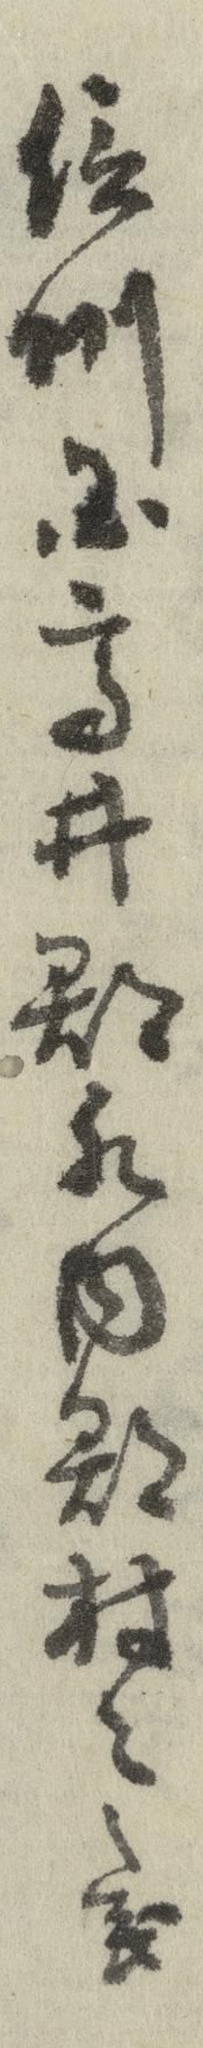信州国高井郡水内郡村々之義
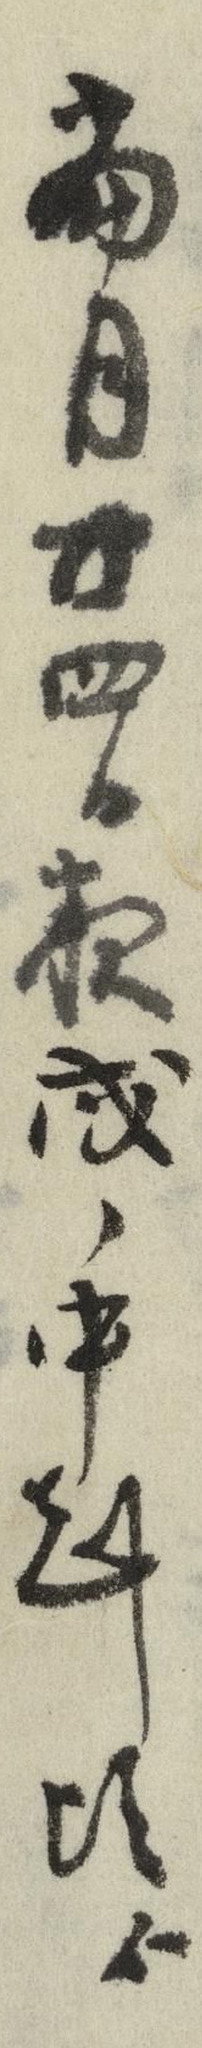当月廿四日夜戌中刻頃ゟ
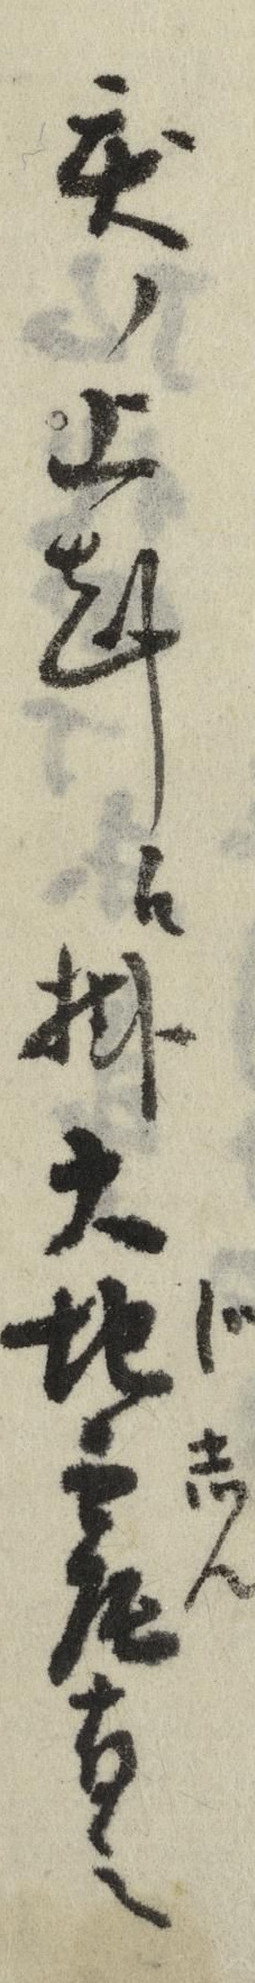亥ノ上刻江掛大地震二有之

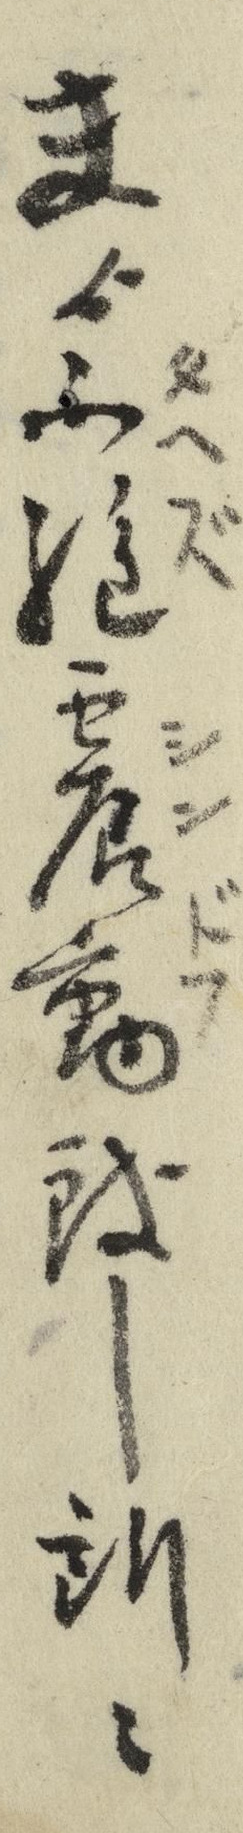夫ゟ不絶震動致し折々
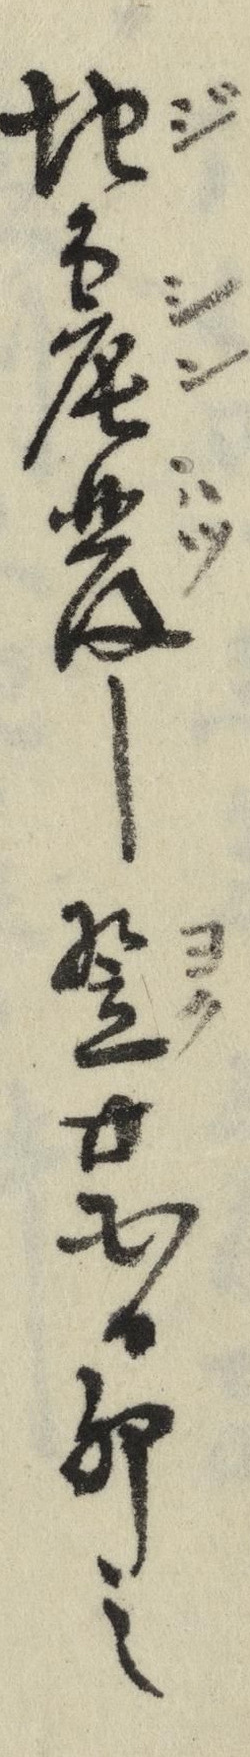地震発し翌廿五日卯之
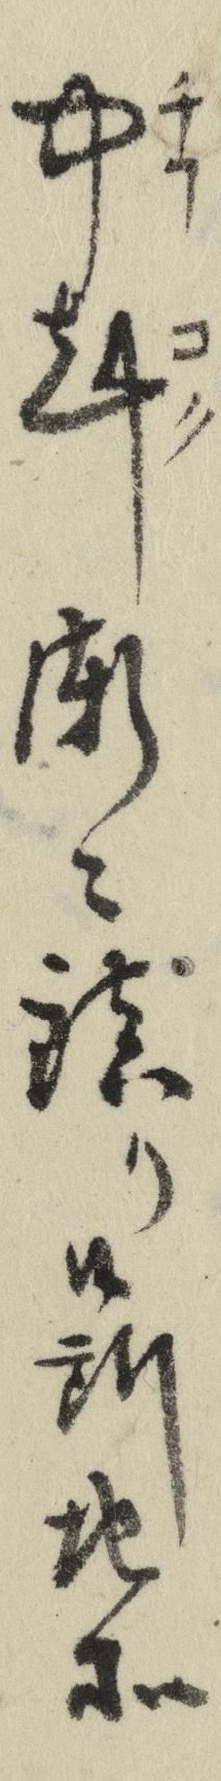中刻漸々鎮り候所地所
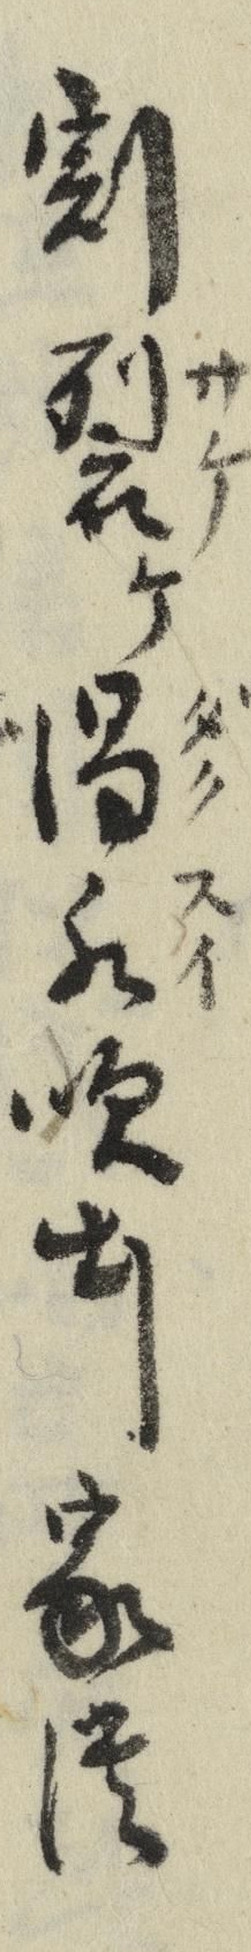割裂ヶ濁水吹出し家潰
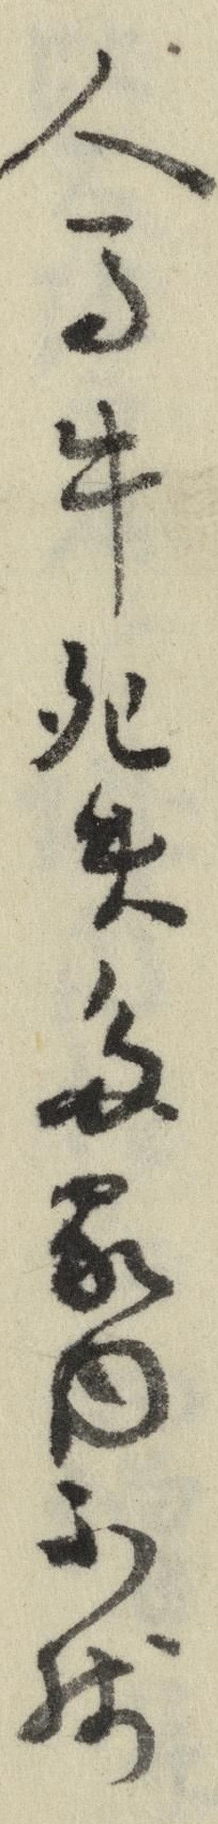人馬牛死失多家内不残
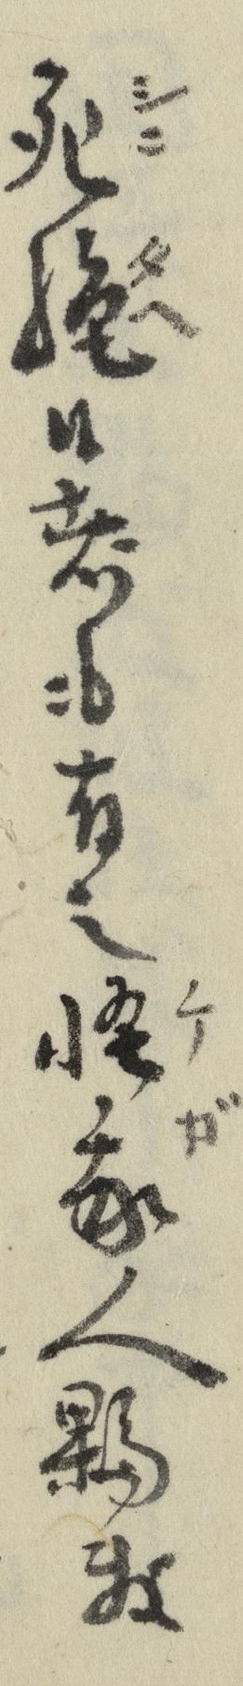死絶候者も有之怪我人夥敷
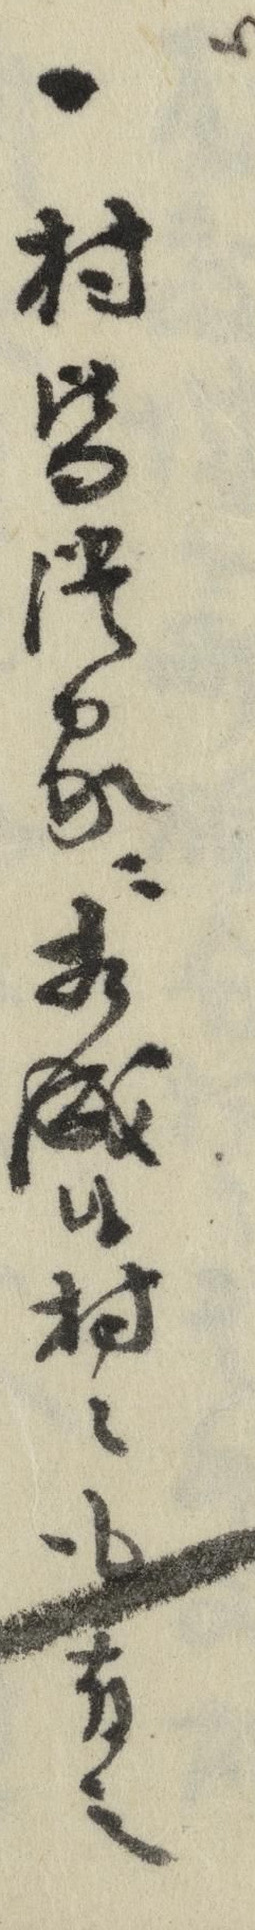一村皆潰家に相成候村々も有之
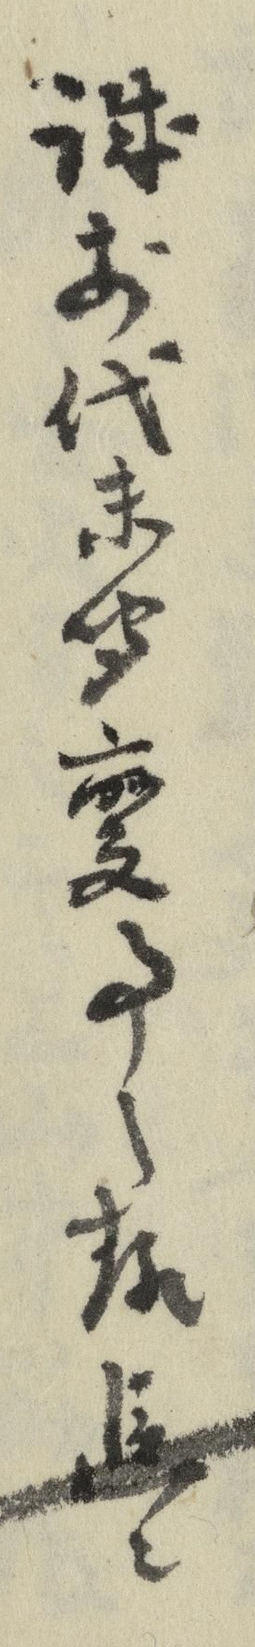誠前代未聞変事之趣追々
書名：信州大地震一件之冩　丁未弘化四年三月吉日
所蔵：東京大学地震研究所図書室 Earthquake Research Institute Library, The University of Tokyo, JAPAN
